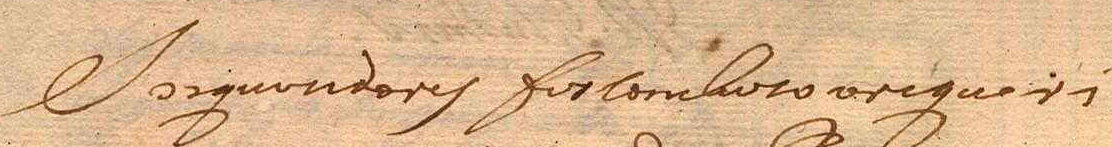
Inquisidores foi concluzo o requeri
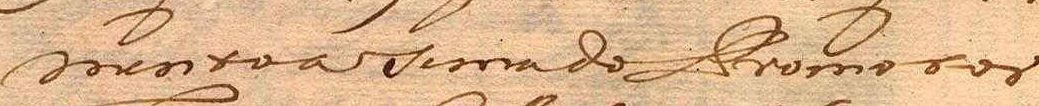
mento asima do Promotor
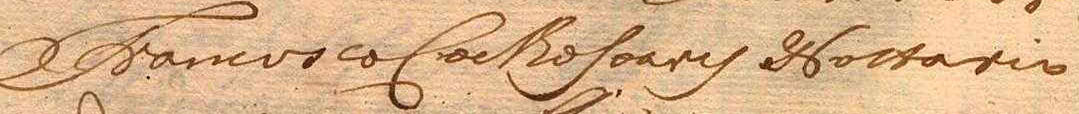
Francisco Coelho Soares Nottario
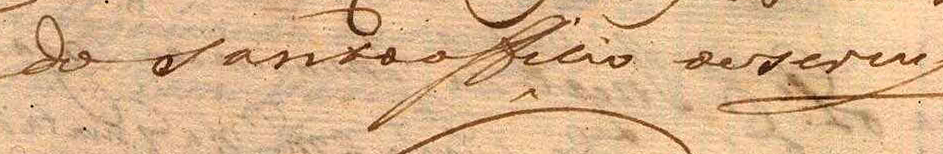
do Santo officio o escreuj
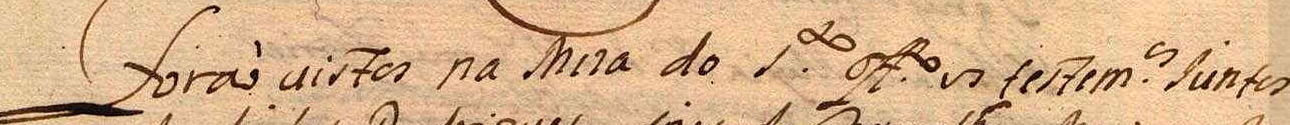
Foraõ uistos na Meza do s.to off.o os testem.os Iuntos
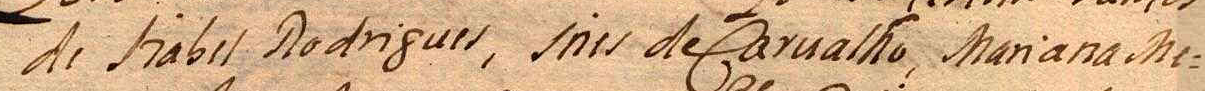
de Izabel Rodrigues, Ines de Carualho, Mariana Me
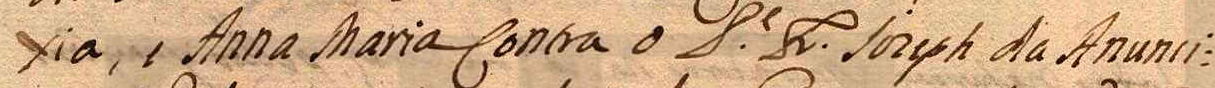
xia, e Anna Maria Contra o P.e Fr. Iozeph da Anunci
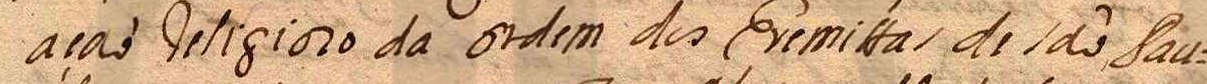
açaõ Religiozo da ordem dos Eremittas de são Pau
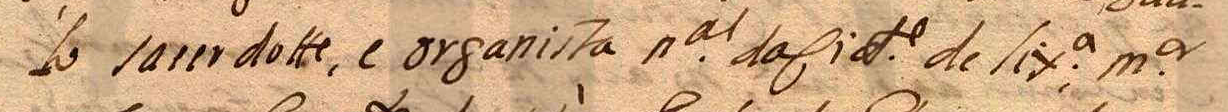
lo sacerdotte, e organista n.al da Cid̄.e de lixa; m.or
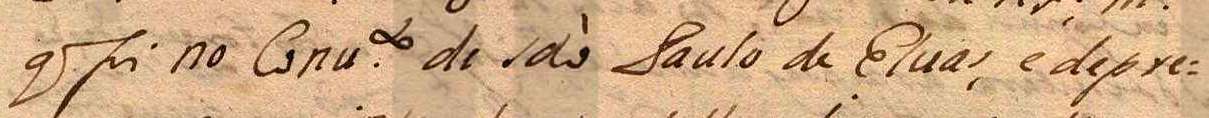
q̄ foi no Conu.to de saõ Paulo de Eluas, e de pre
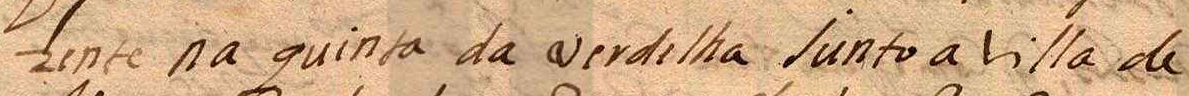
zente na quinta da verdelha Iunto a villa de
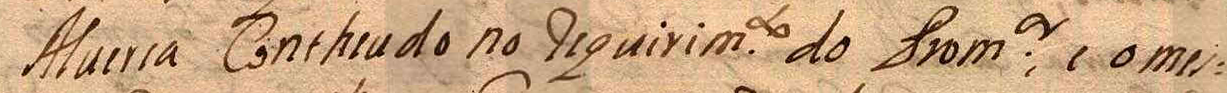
Aluerca Contheudo no Requirim.to do Promor; e o mes
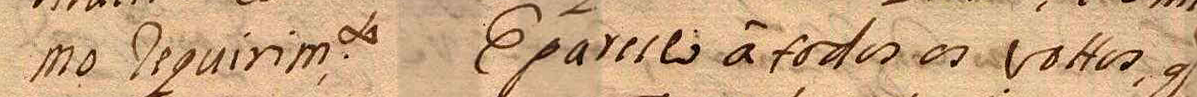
mo Requirim.to E paresceo à todos os vottos, q̄
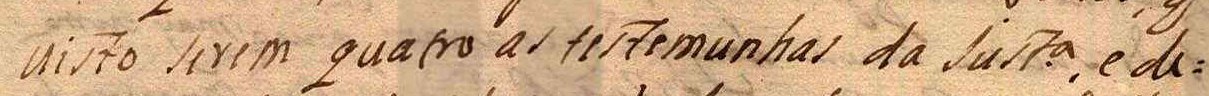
uisto serem quatro as testemunhas da Iust.a, e de
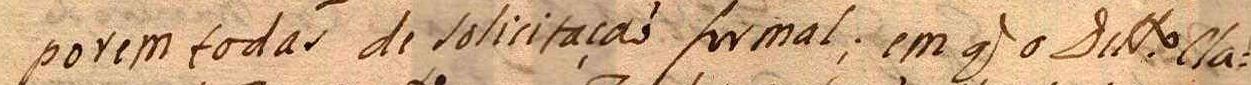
porem todas de solicitaçaõ formal; em q̄ o Delt.o cla
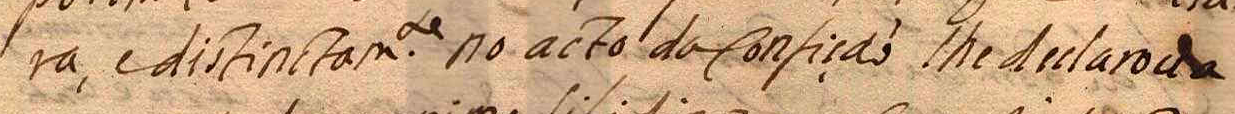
ra, e distinctam.te no acto da Confiçaõ lhe declarou a
